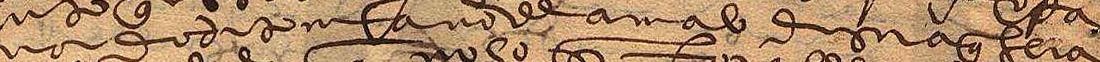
uor do dito manoell amado disera q̄ hera
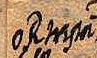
o R tristā
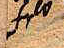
frco
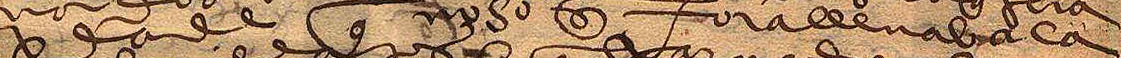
ꝟdade q̄ noso s̄r fora lleuado a ca
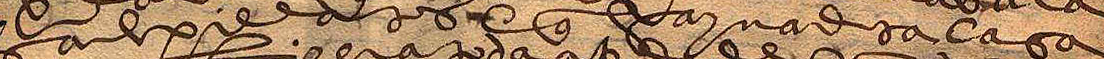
sa de pillatos e q̄ haj na dita casa
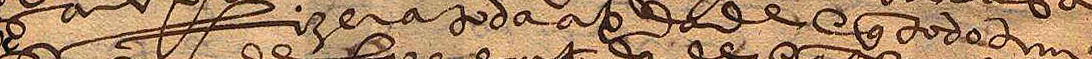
se fizera toda a ꝟdade e q̄ todo tem
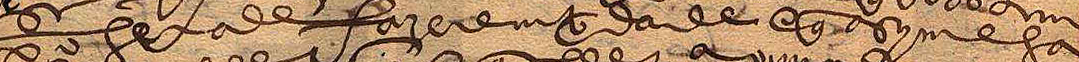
po hera de fazerem ꝟdade e q̄ asym lha
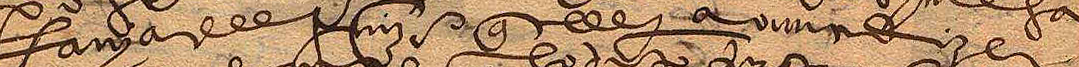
farya elle Juiz e q̄ elle ta ouuio dizer
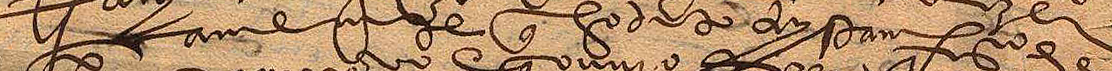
p̄camemte q̄ ho dito trystam frco he
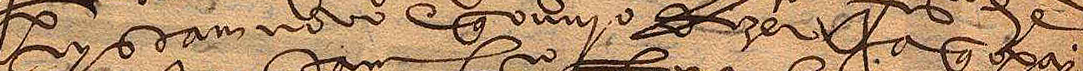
crystam novo e q̄ ouujo dizer Ja q̄ o pay
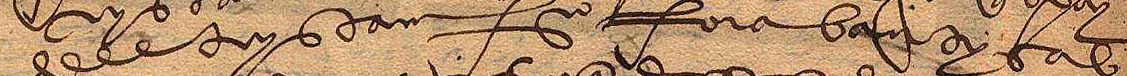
delle trystam frco fora bautysado
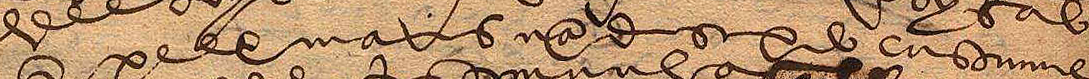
ē pee e mais nā dise e do custume
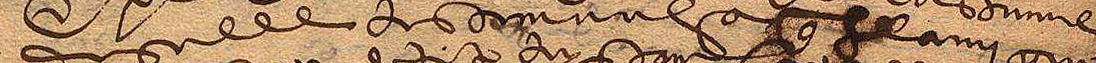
dise ele testemunha q̄ he amjguo
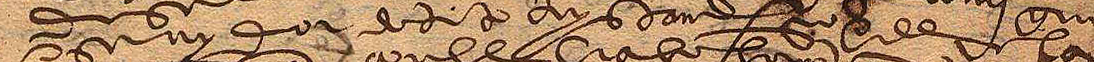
e seruydor do dito trystam frco e decla
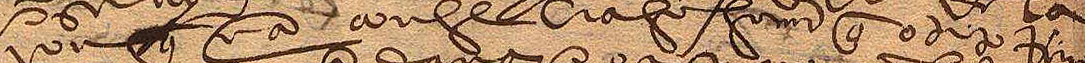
rou q̄ nā conhecia ho homē q̄ o dito Rem
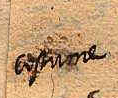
costume
